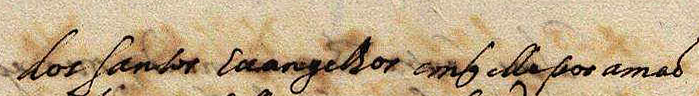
dos santos Euangelhos em q̄ ella pos a maõ
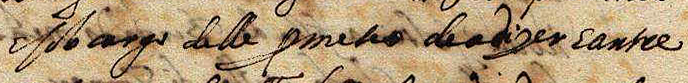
E sob cargo delle ꝓmeteo de a dizer E antre
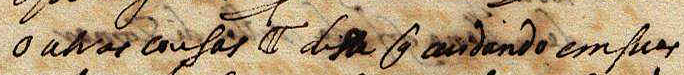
outras cousas ⁋ disse q̄ cuidando em suas
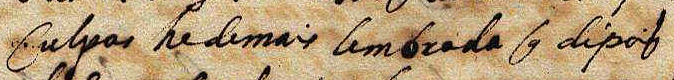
Culpas he de mais lembrada q̄ dipois
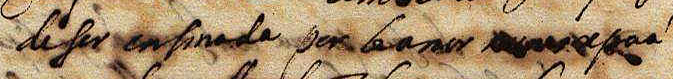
de ser ensinada por Leanor nunes xpaā
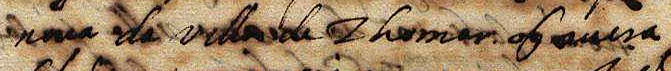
noua da villa de Thomar o q̄ auera
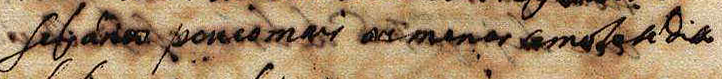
seis ānos pouco mais ou menos como se tē dito
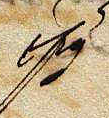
tpꝯ̄
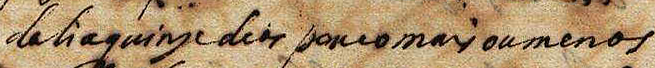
dali a quinze dias pouco mais ou menos
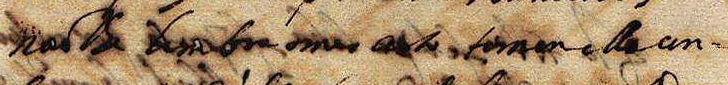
naõ lhe lembra o mes acto tomou ella con
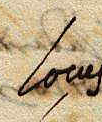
locus
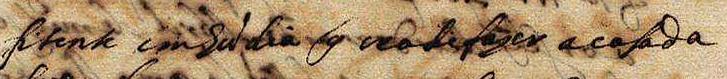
fitente em hū dia q̄ era de fazer a casa da
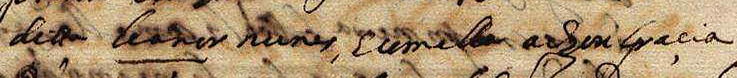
ditta Leanor nunes, E com ella achou Gracia
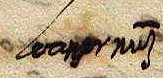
Leanor mīz
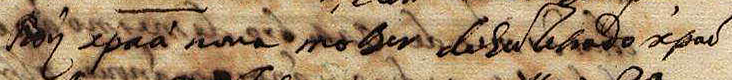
Roiz̄ xpaā noua molher de hū letrado xpaõ
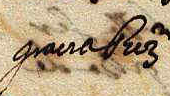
gracia Roz̄
